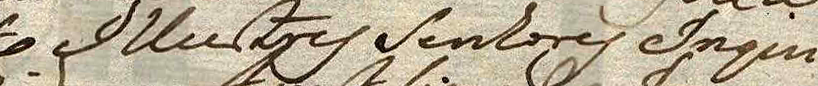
to Illustres Senhores Inqui
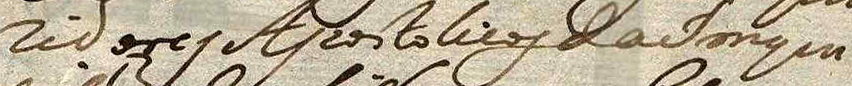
zidores Apostolicos da Imqui
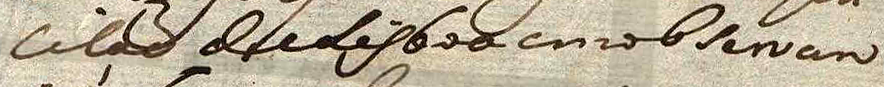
ciçaõ de Lisboa em observan
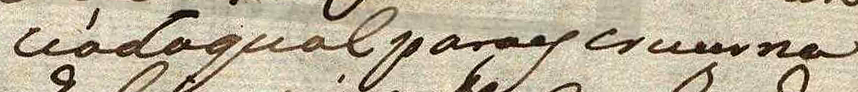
cia da qual para escreuer na
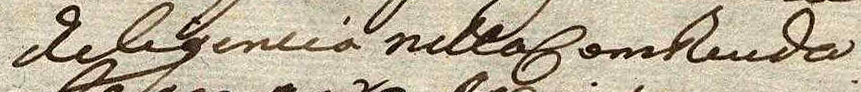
deligencia nella Comtheuda
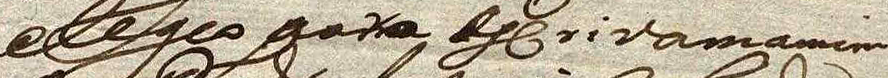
elegeo para escrivam a mim
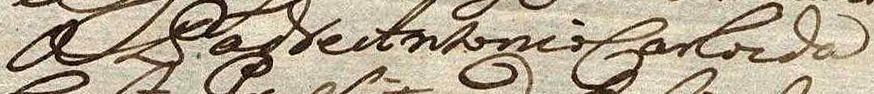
O Padre Antonio Carloz da
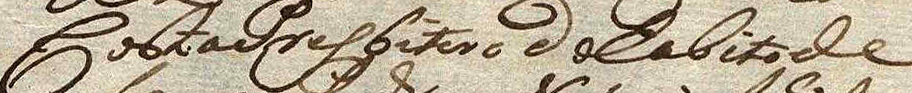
Costa Presbitero do habito de
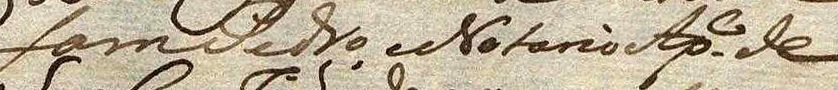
sam Pedro, e Notario Ap.co de
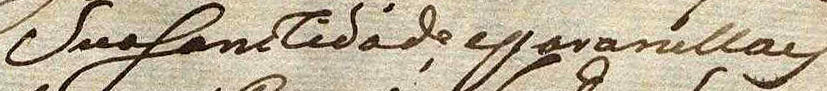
Sua sanctidade, e para nella es
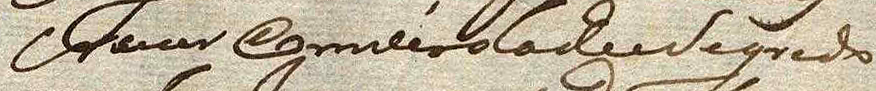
Creuer Com verdade e Segredo
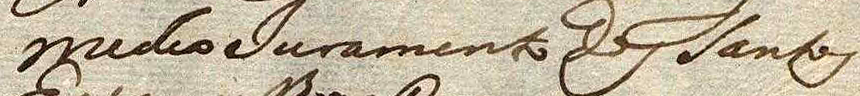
me deo Iuramento dos Santos
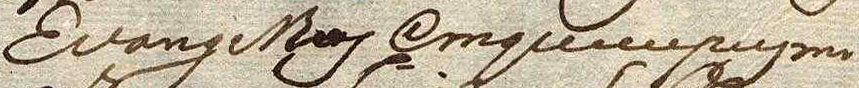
Evangelhos em que eu pus mi
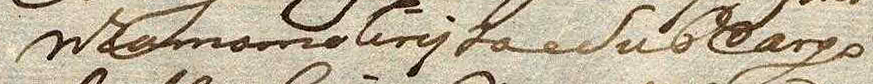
nha mam direjta e Sub cargo
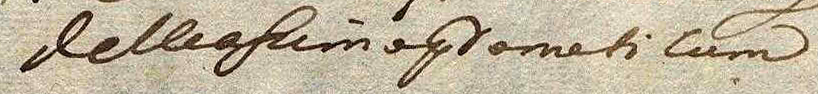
delle assim o prometi cum
